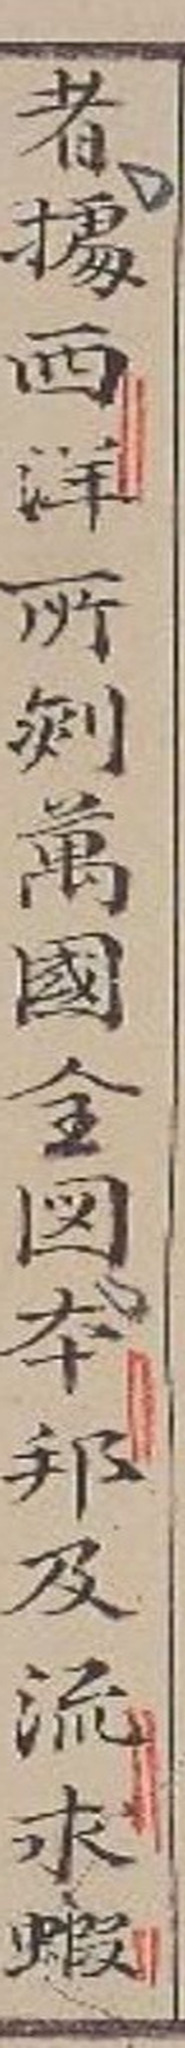者。拠西洋所刻万国全図。本邦及流求蝦
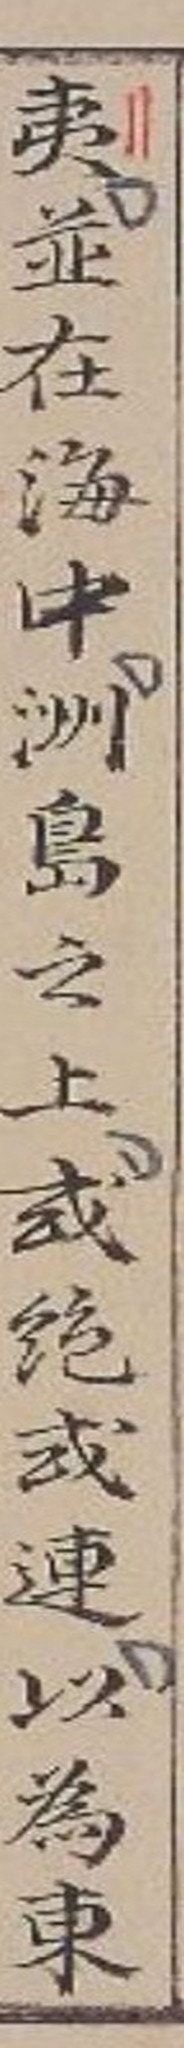夷。並在海中。洲島之上。或絶或連。以為東
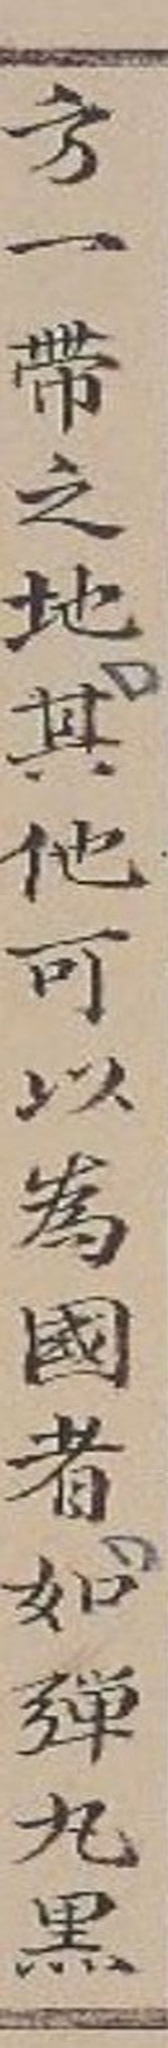方一帯之地。其他可以為国者。如弾丸黒
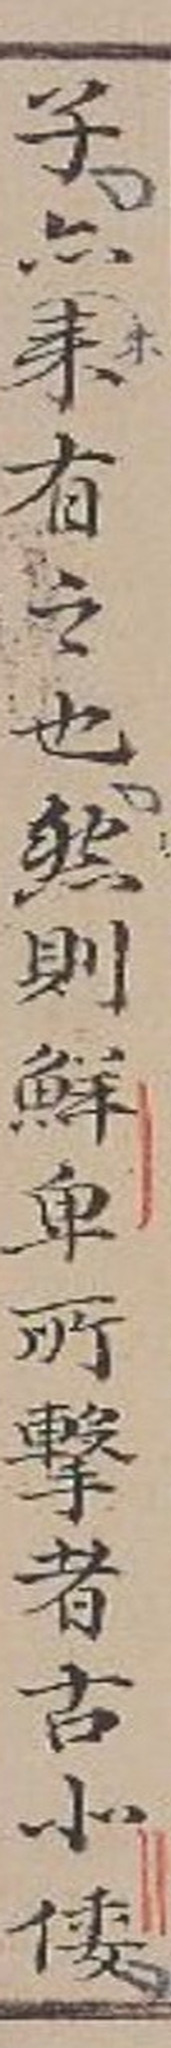子。亦来未有之也。然則鮮卑所撃者古北倭。
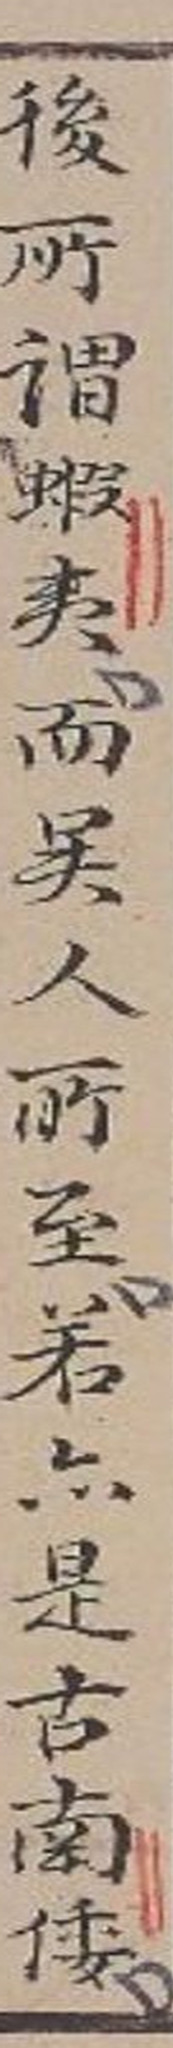後所謂蝦夷。而呉人所至。若亦是古南倭。

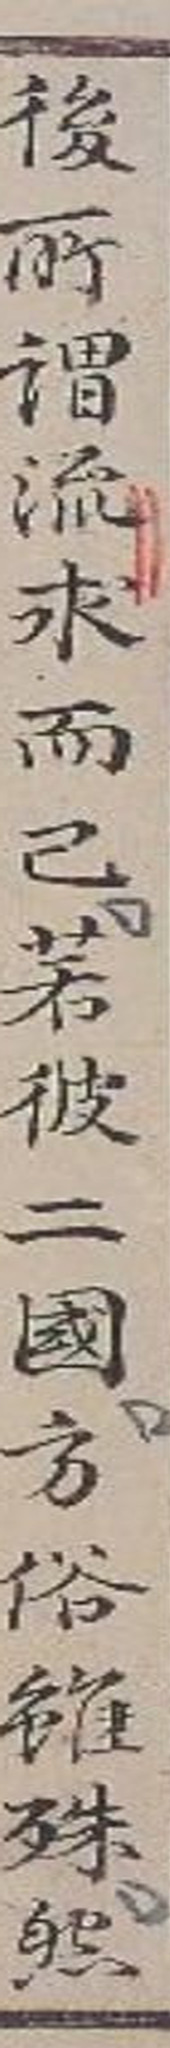後所謂流求而己。若彼二国。方俗雖殊。然
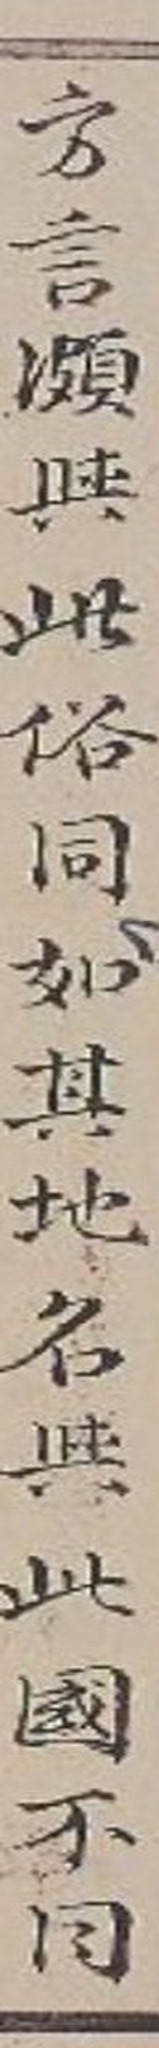方言頗与此俗同。如其地名与此国不同
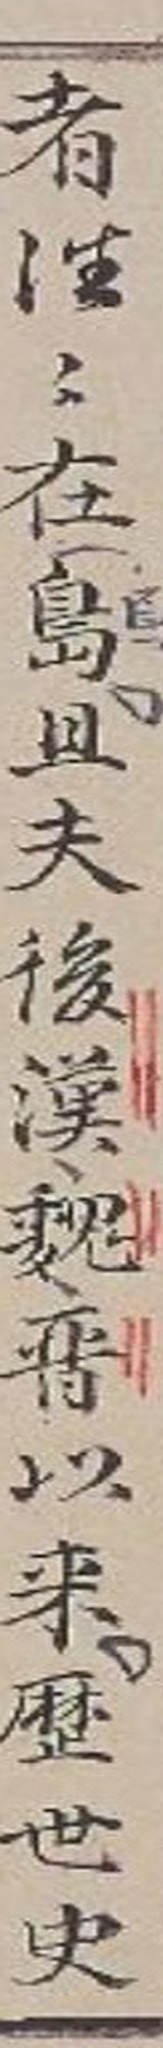者往々在島焉。且夫後漢・魏・晋以来。歴世史
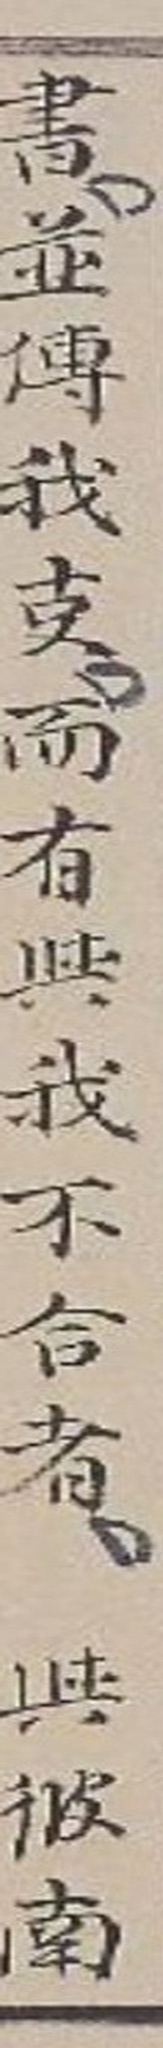書。並伝我事。而有与我不合者。与彼南
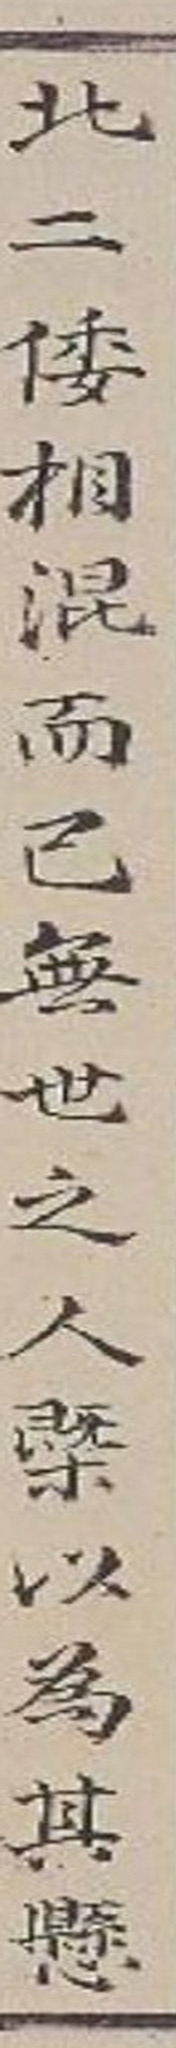北二倭相混而已無世之人概以為其懸
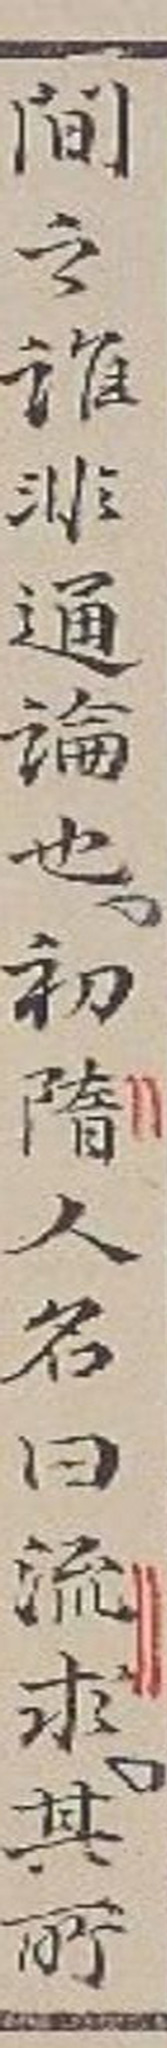間之誰非通論也。初隋人名曰流求。其所
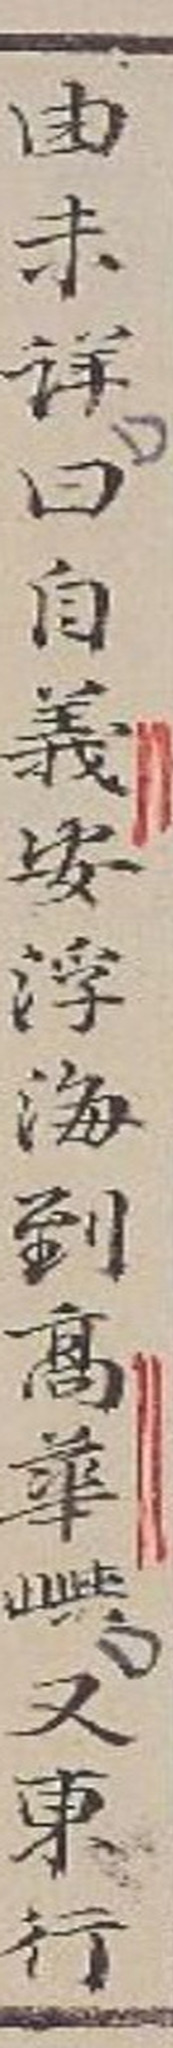由未詳。曰自義安浮海到高華嶼。又東行
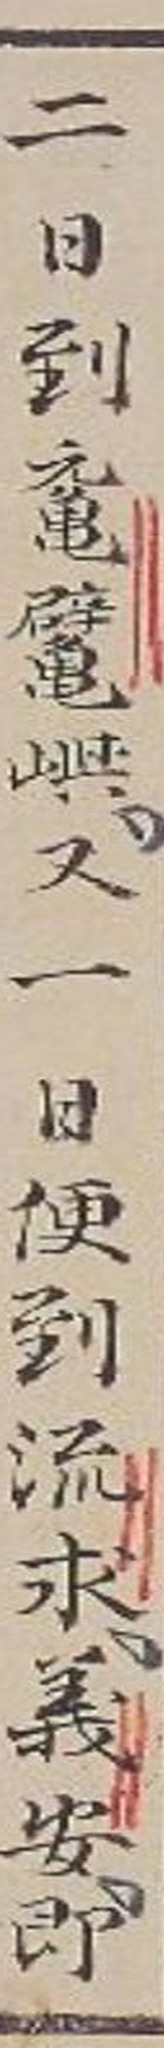二日到黿鼊嶼。又一日便到流求。義安。即
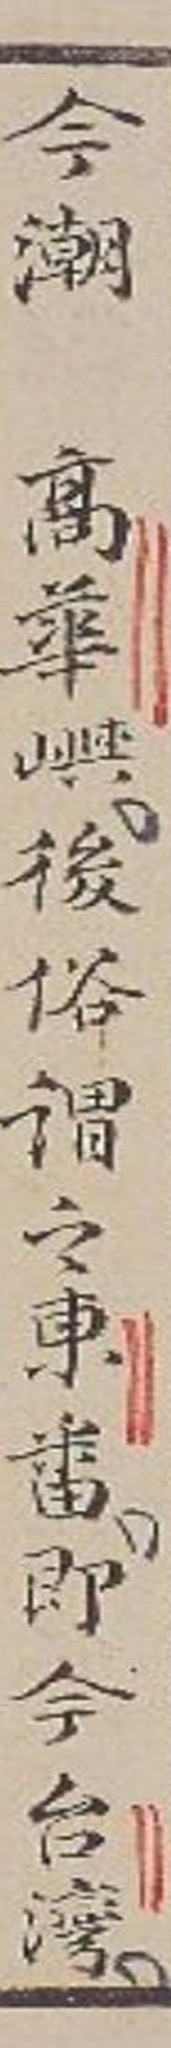今潮高華嶼。後俗謂之東番。即今台湾。
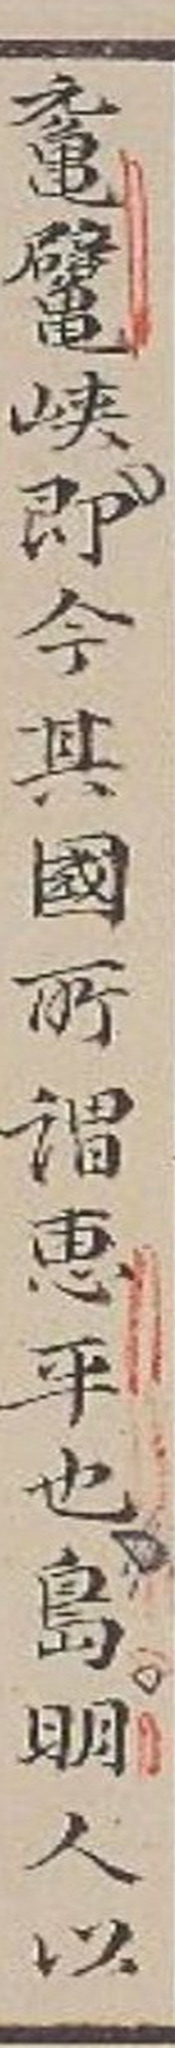黿鼊峡。即今其国所謂恵平也島。眀人以
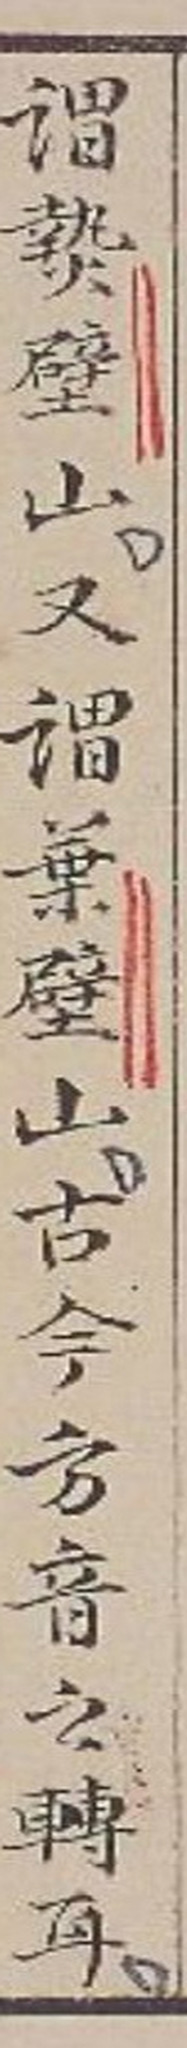謂熱壁山。又謂葉壁山。古今方音之転耳。
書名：南島志 全
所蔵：University of the Ryukyus Library
